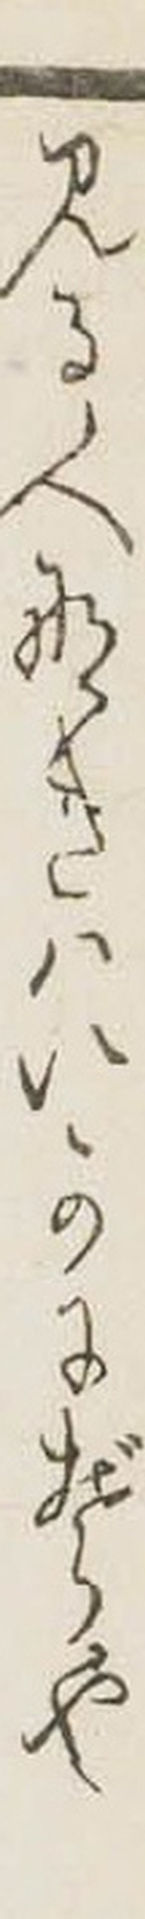見る人なきはいかにぞや
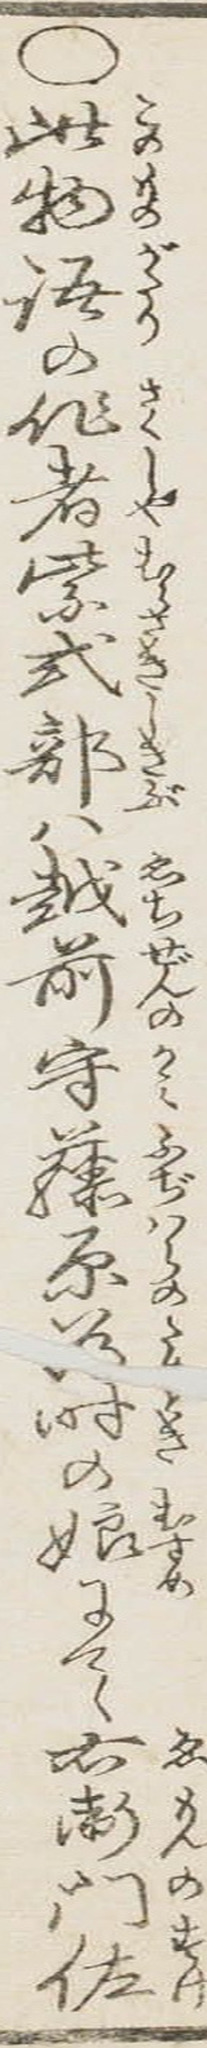○此物語の作者紫式部は越前守藤原為時の娘にて右衛門佐
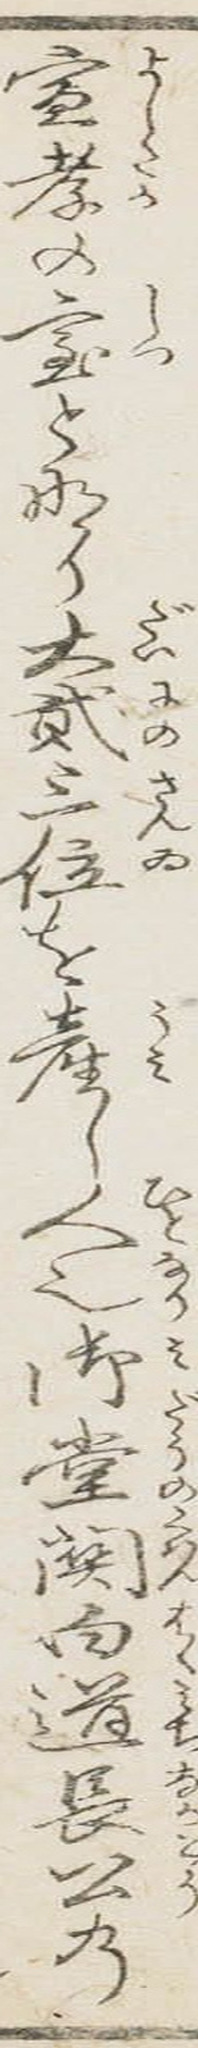宣孝の室となり大弐三位を産し人也御堂関白道長公の
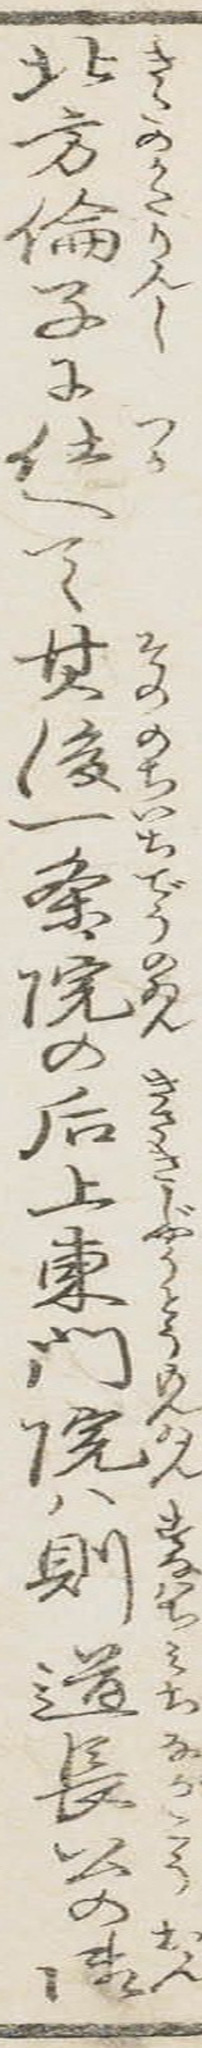北方倫子に仕へて其後一条院の后上東門院は則道長公の御
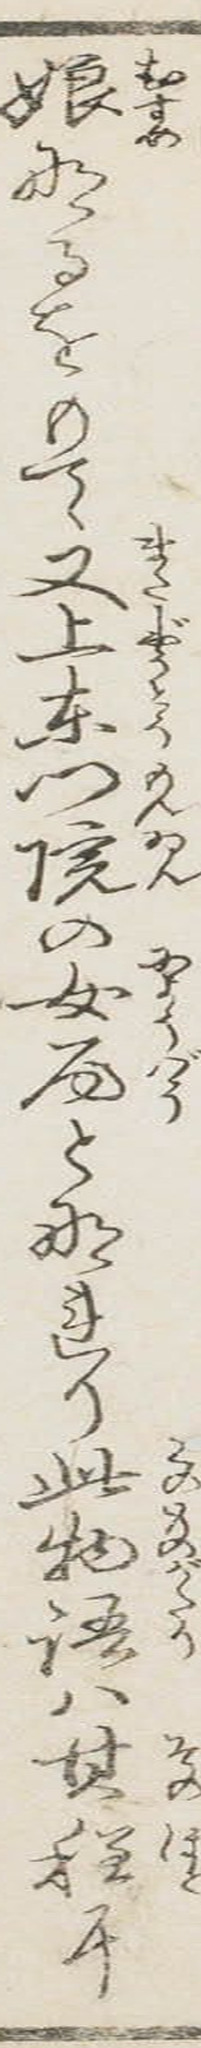娘なるをもて又上東門院の女房となれり此物語は其程に
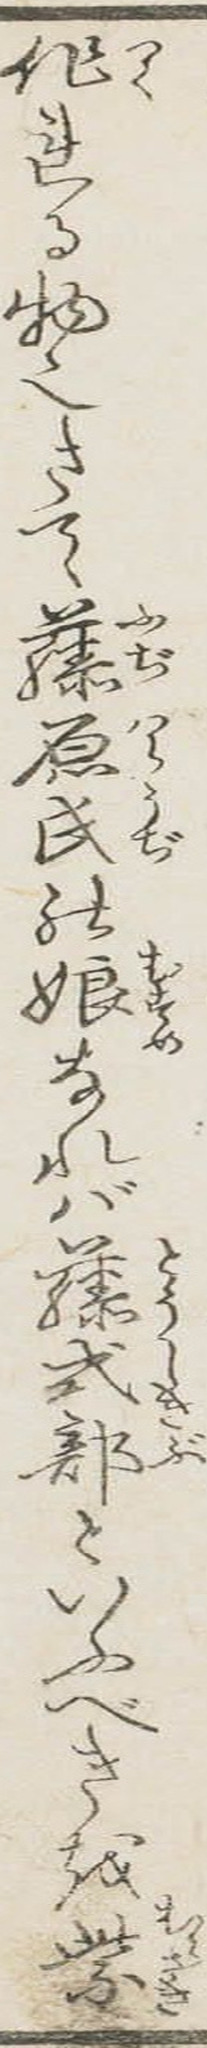作れる物也さて藤原氏の娘なれば藤式部といふべきを紫
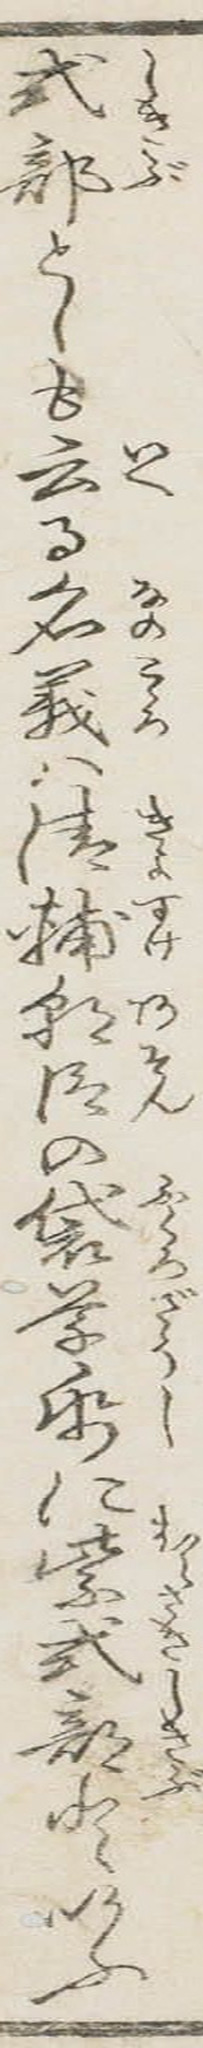式部としも云る名義は清輔朝臣の袋草子に紫式部といふ
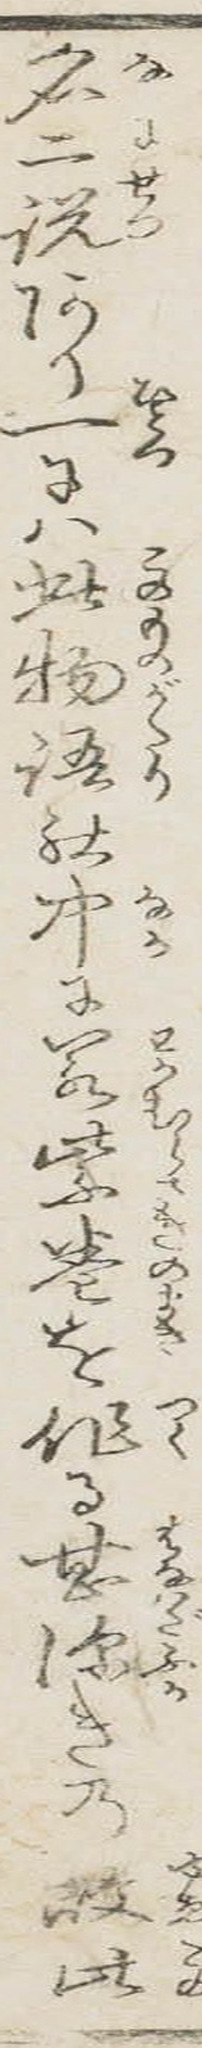名二説あり一には此物語の中に若紫巻を作る甚深きの故此
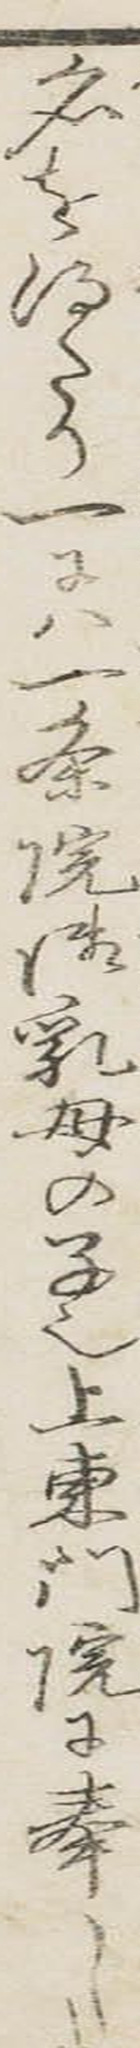名を得たり一には一条院御乳母の子也上東門院に奉しむると
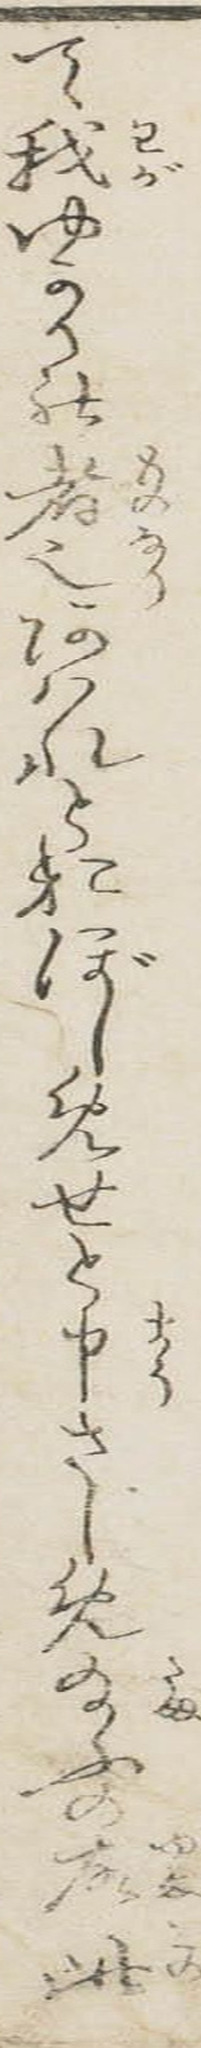て我ゆかりの者也あはれとおぼしめせと申さしめ給ふの故此
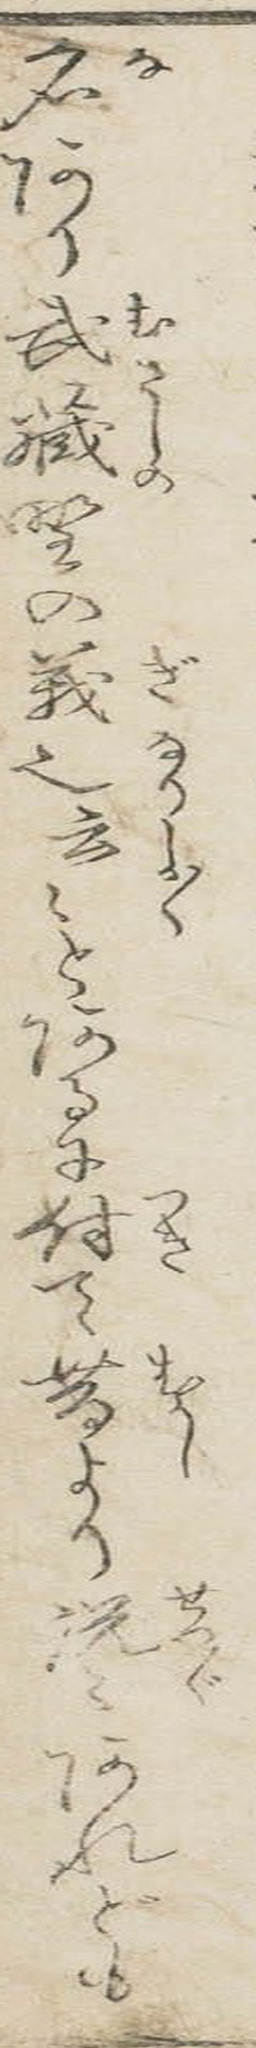名あり武蔵野の義也云々とあるに付て昔より説々あれども

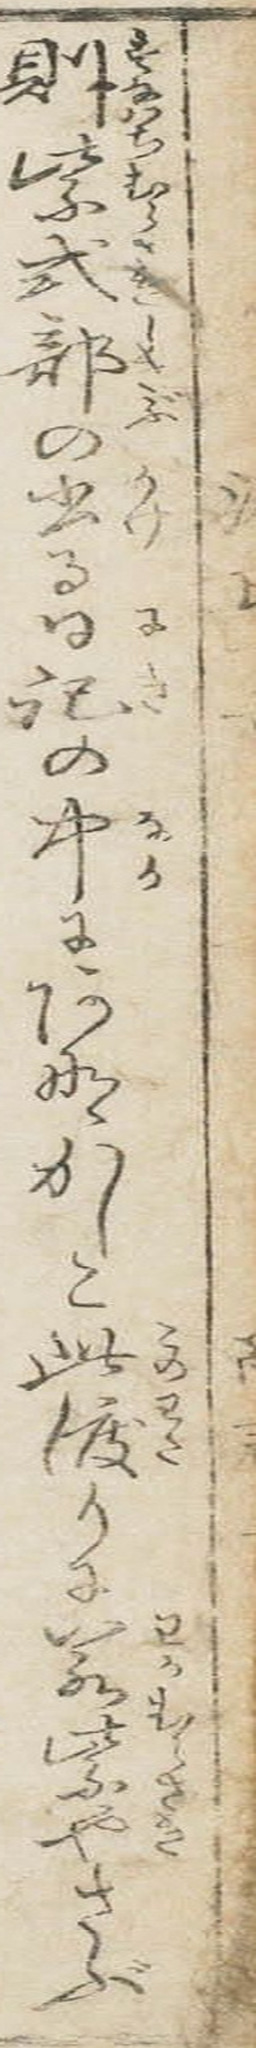則紫式部の書る日記の中にあなかしこ此渡りに若紫やさぶ
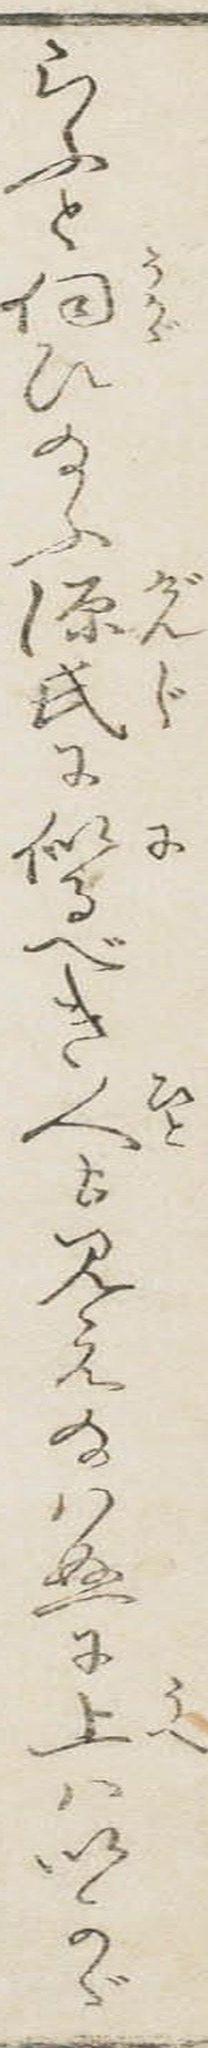らふと伺ひ給ふ源氏に似るべき人も見え給はぬに上はいかゞ
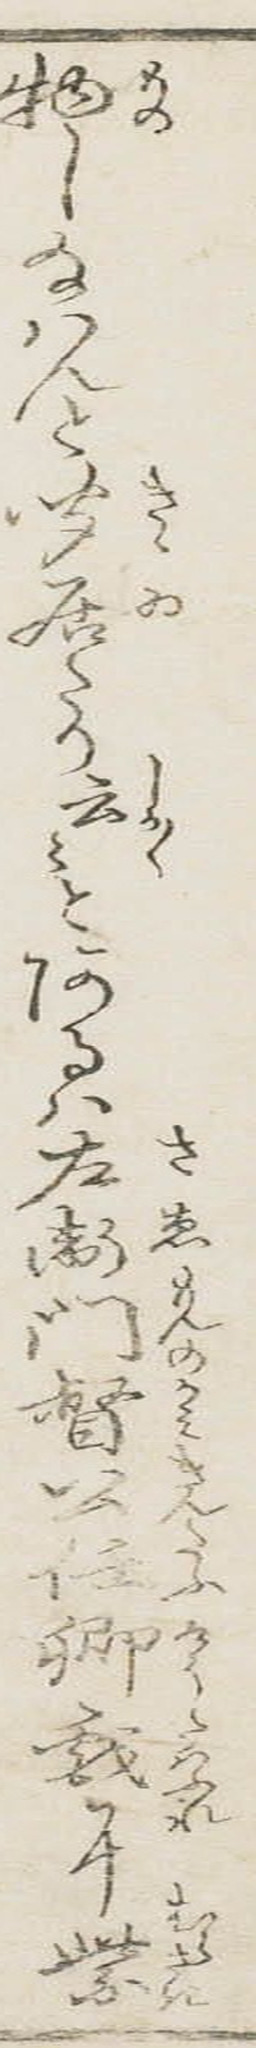物し給はんと聞居たり云々とあるは左衛門督公任卿戯に紫
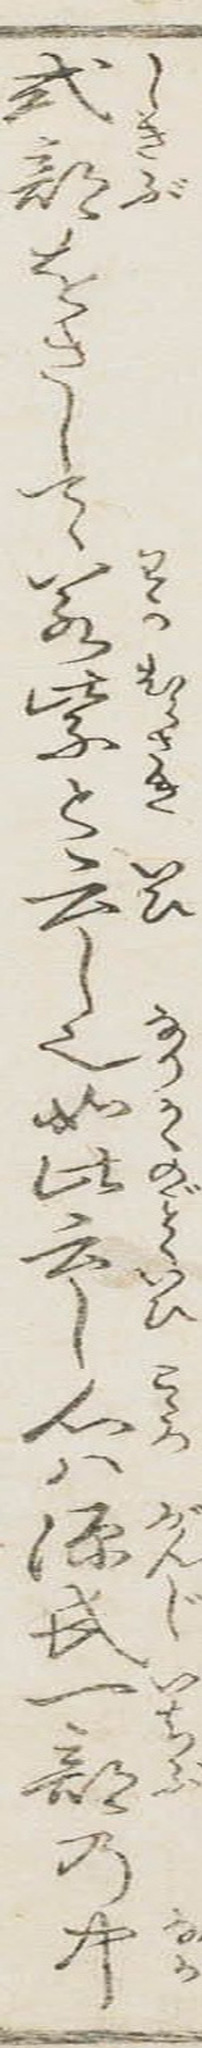式部をさして若紫と云し也如此云し心は源氏一部の中
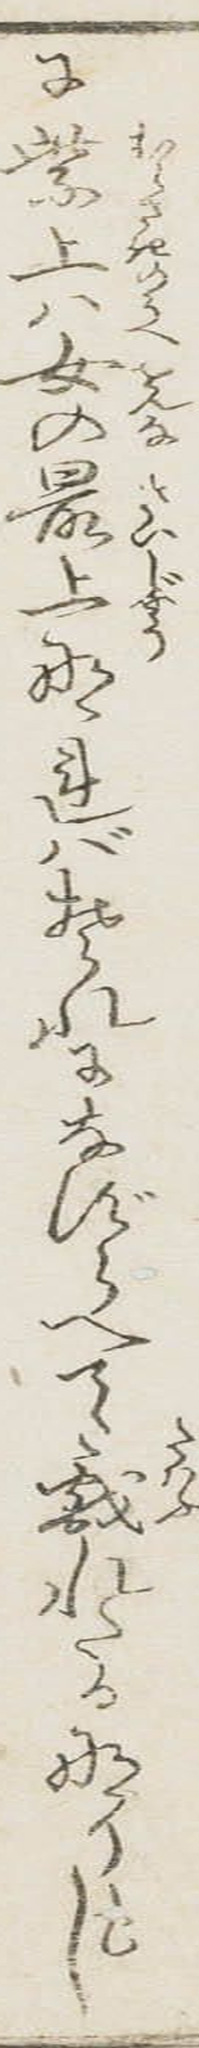に紫上は女の最上なればそれになずらへて戯れたるなりもし
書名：源氏百人一首
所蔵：東京学芸大学教育コンテンツアーカイブ
